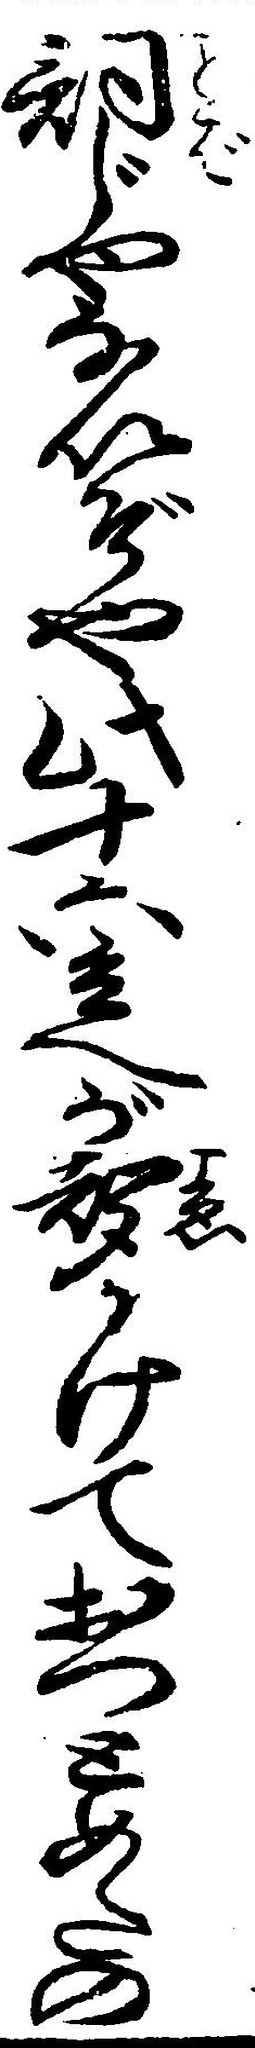詞じやないぞや此十六兵衛が声かけておつとめたの
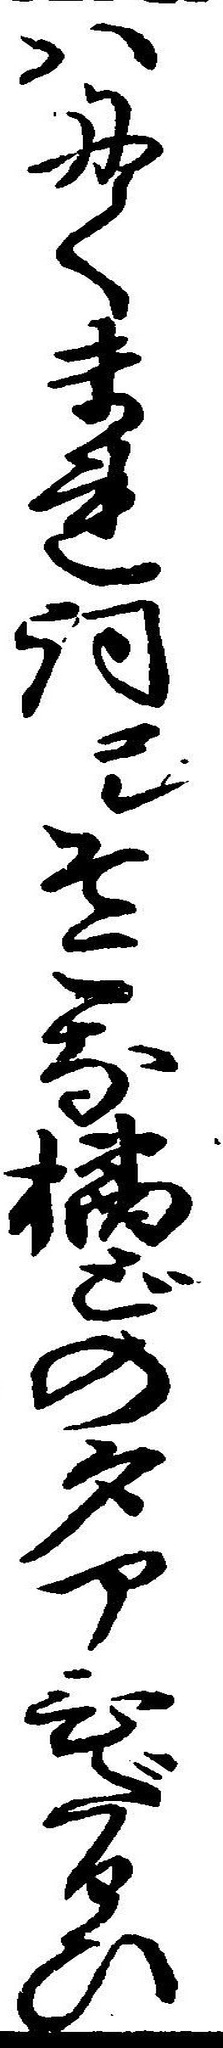はにくまれ詞コレそこな橘どの夕へひだるひ
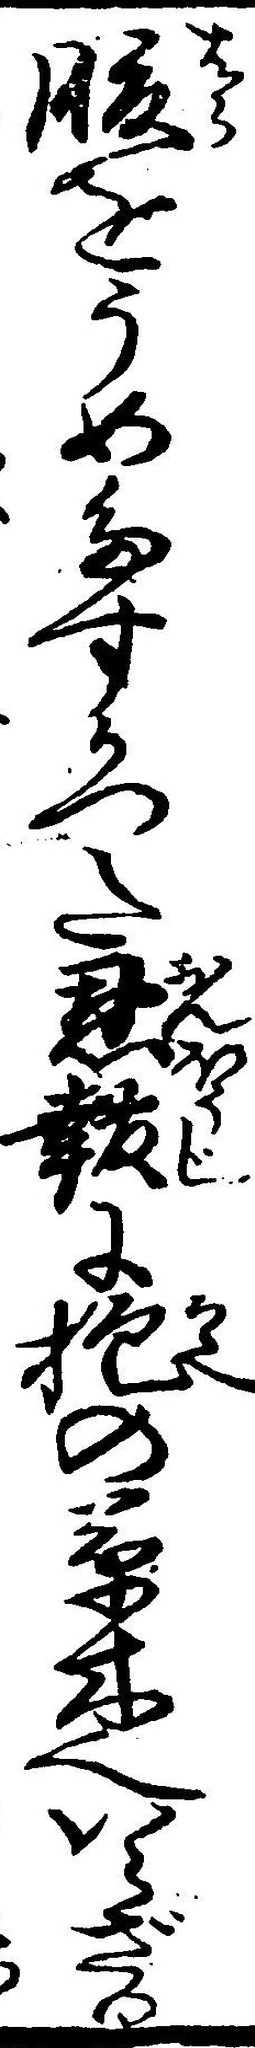腹をうめたすかつた恩報に抱の草木へいらざる
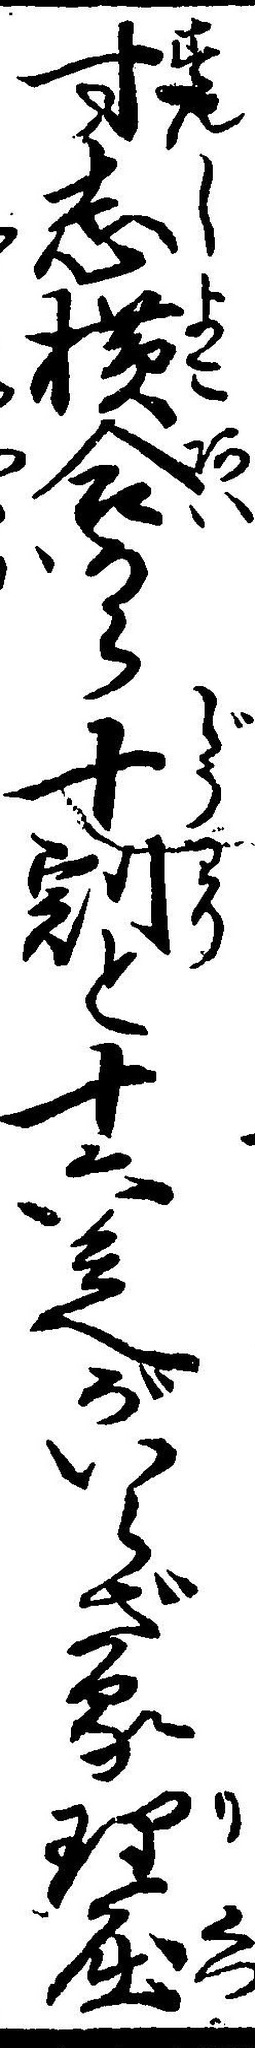寸志横合から十割と十六兵衛がいらざる理屈
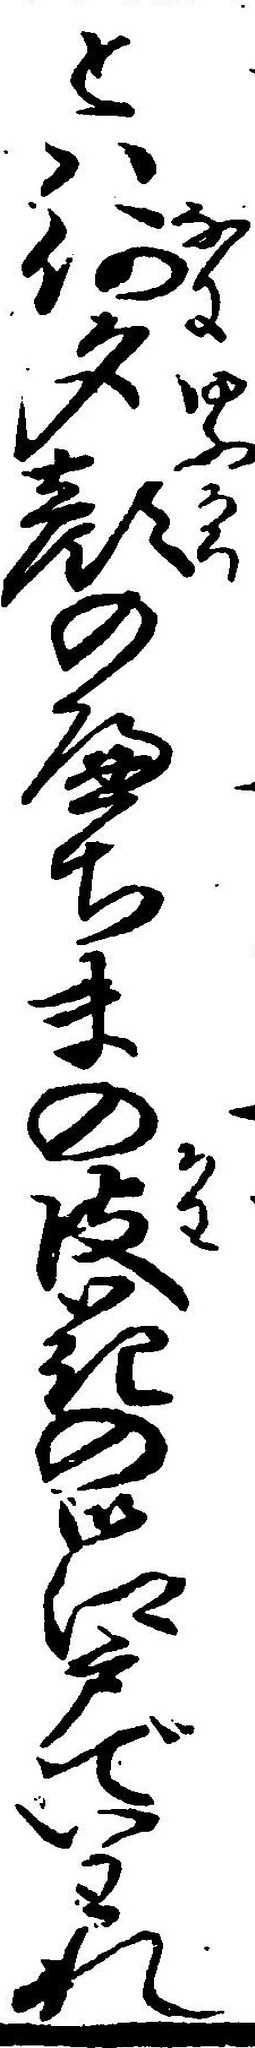とは何夕顔のへちまの皮花の御江戸でいわれ
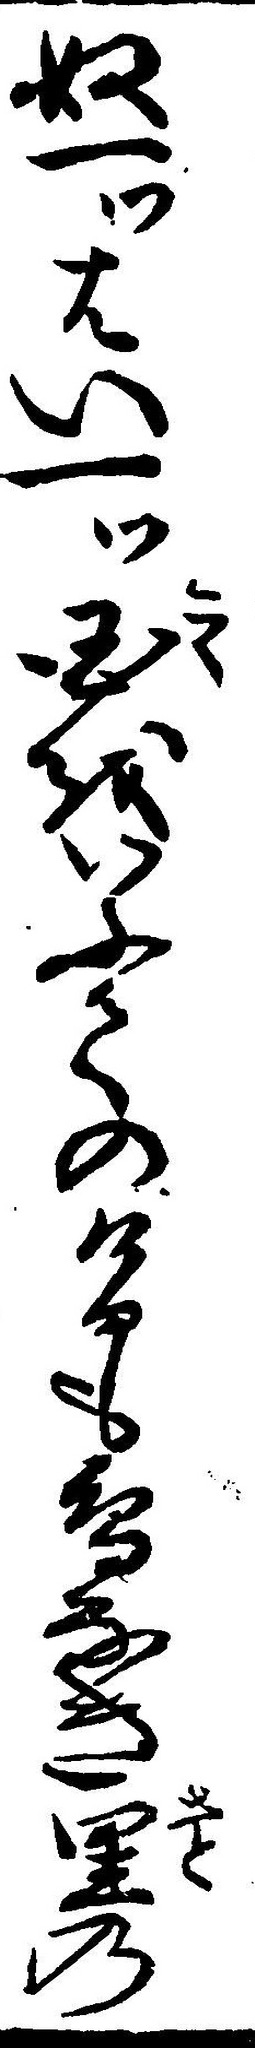ぬ一ッはい一ッ国をいふてのけるも鳥無き里の
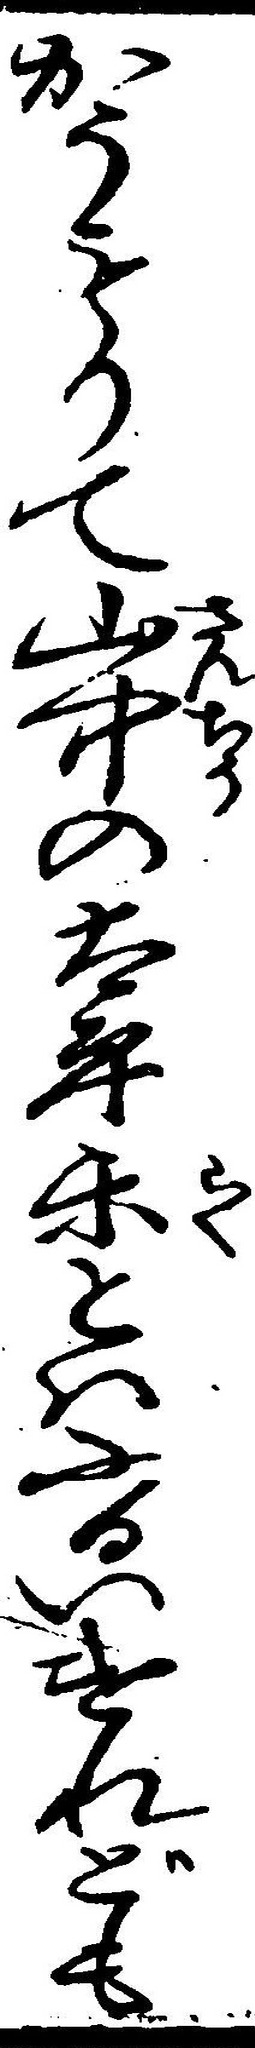かうもりて山中の太平楽とはふるいけれども
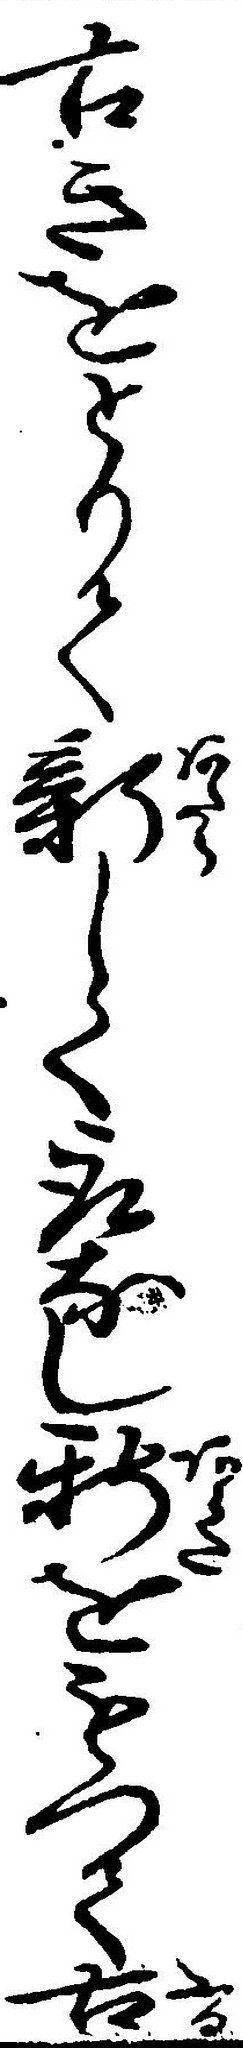古きをとりて新しく取なし新をもつて古
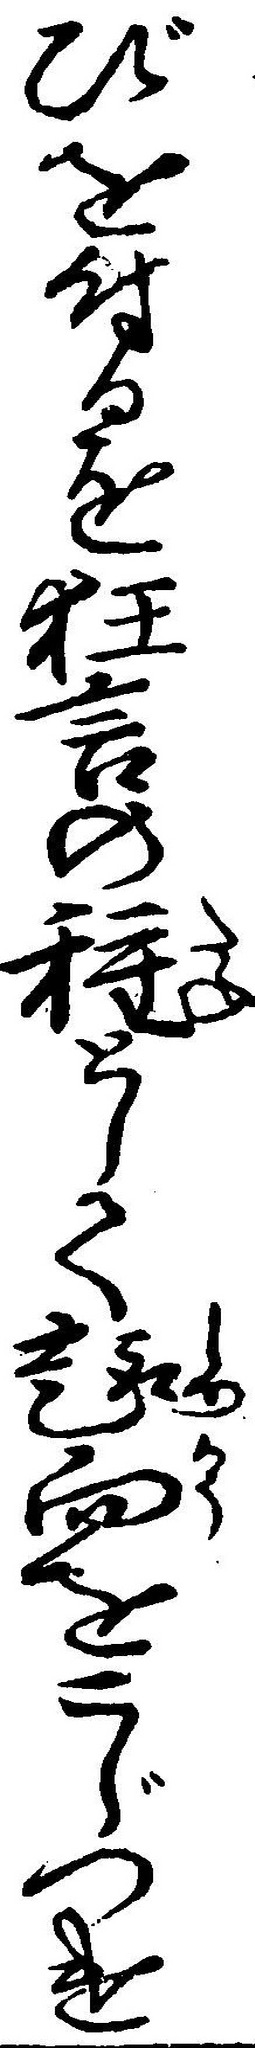びを付るを狂言の種として趣向をこじつけ
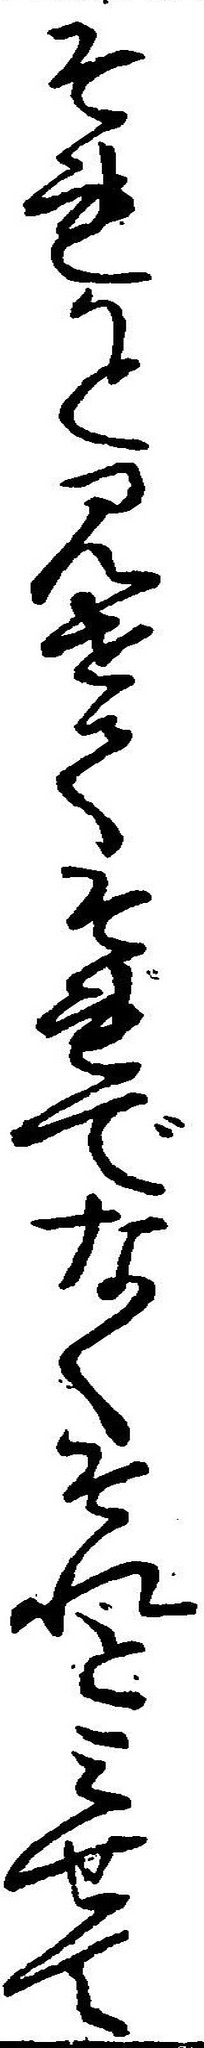それかと見せてそれでなくそれとみせて
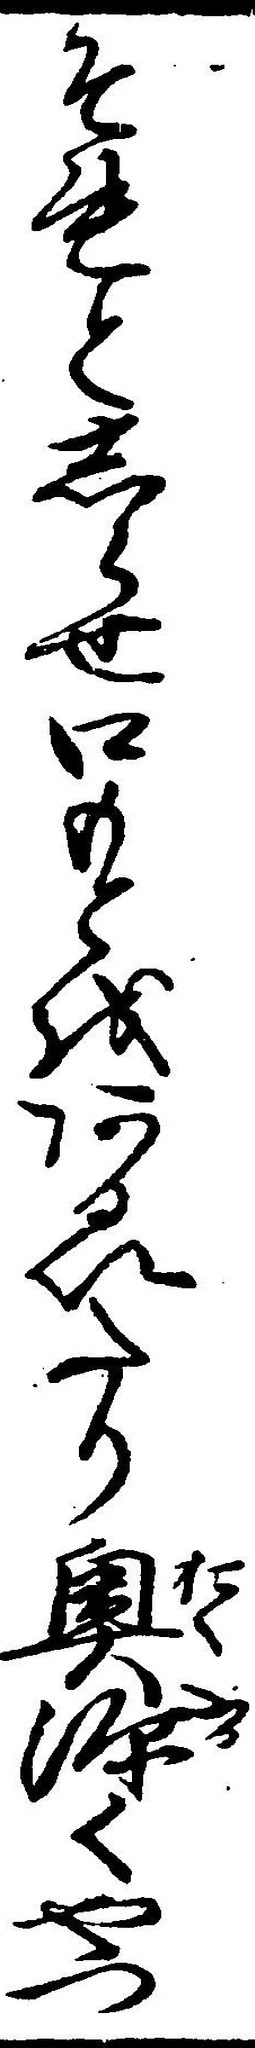それとしらせ口もとをあるいたり奥深くやつ
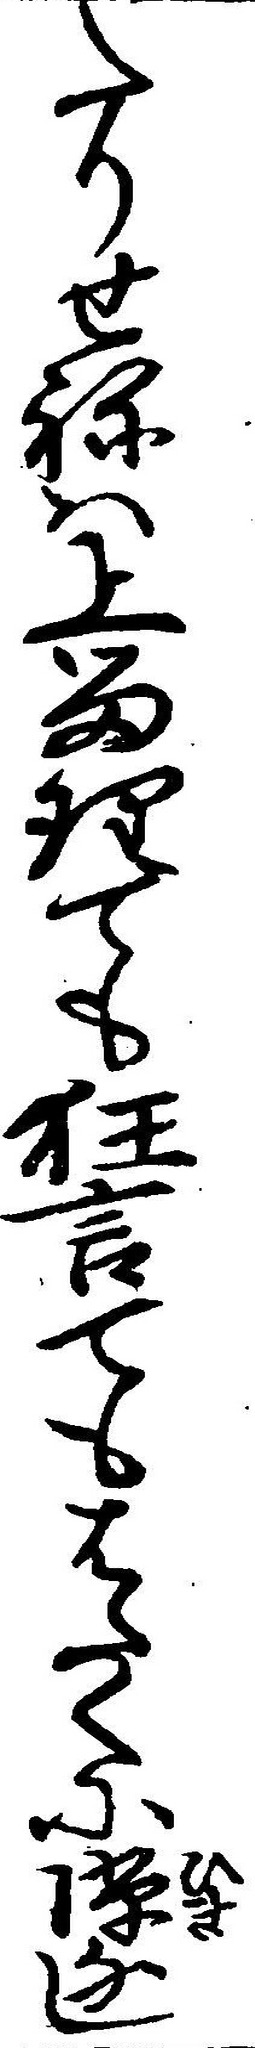たりせねは上留理ても狂言てもはたくに隙なし
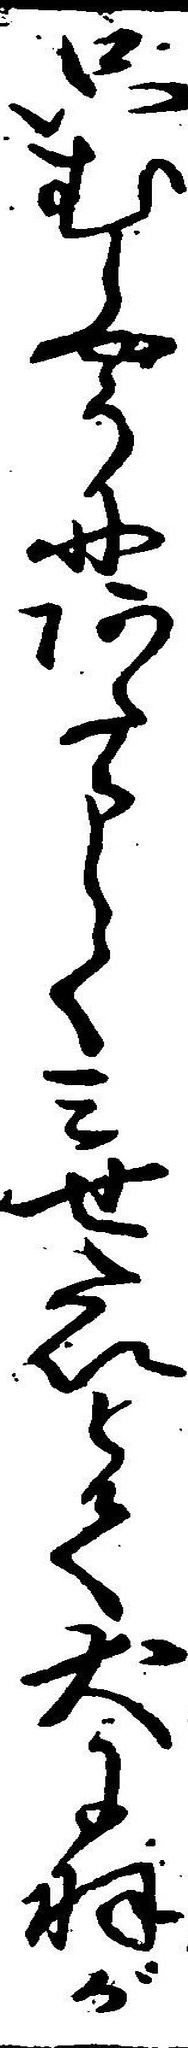只むしやうにあたらしくみせたいとて犬に羽が

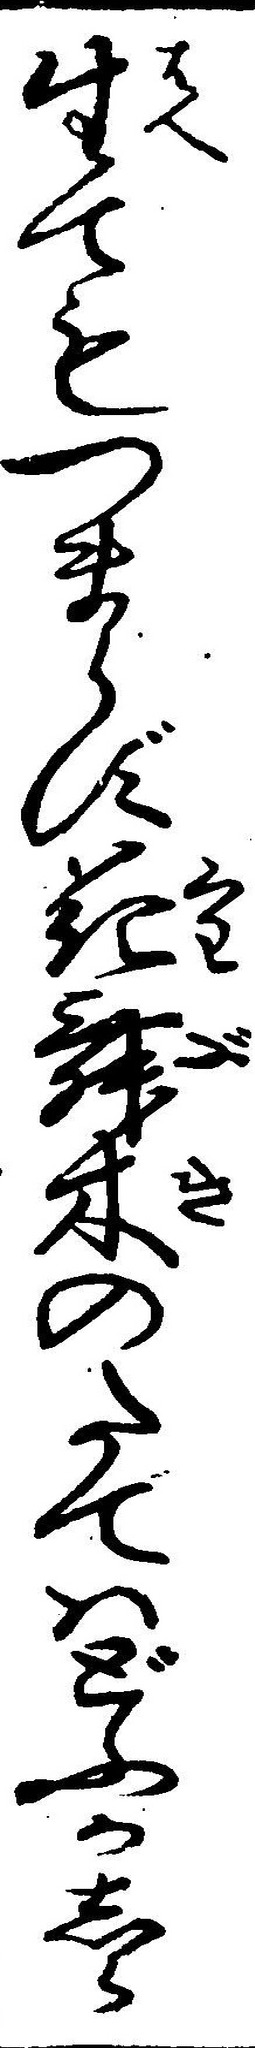生てもつまらず花舞木のたてはどふかしら
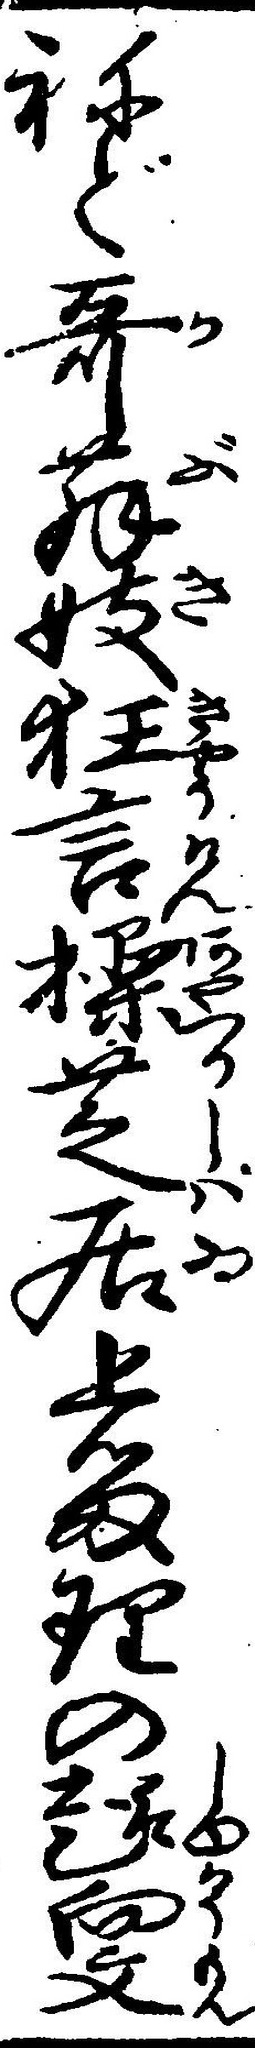ねど歌舞伎狂言操芝居上留理の趣向文
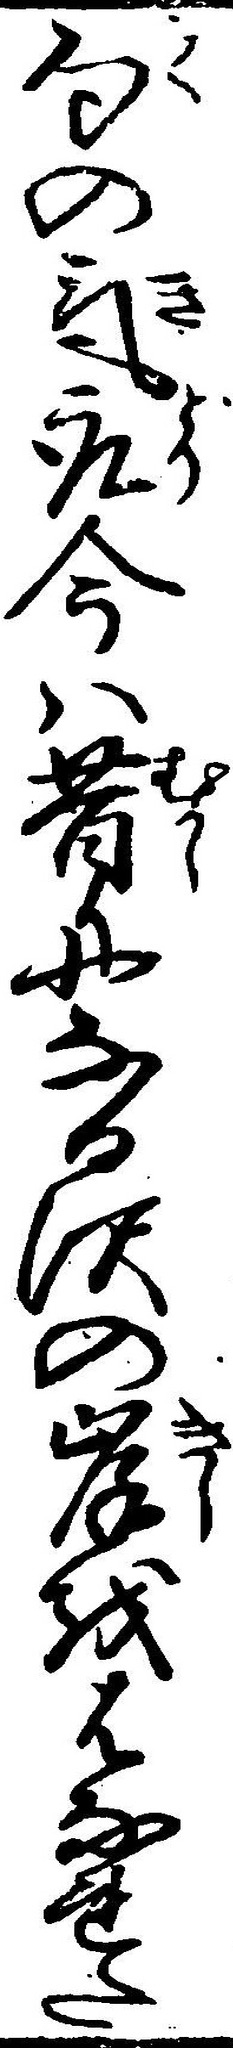句の気取今は昔にふる沢の岸をはなれた
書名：草木芝居化物退治 / 泉花堂三蝶(十六兵衛)作
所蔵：東京大学総合図書館 General Library in the University of Tokyo, JAPAN
